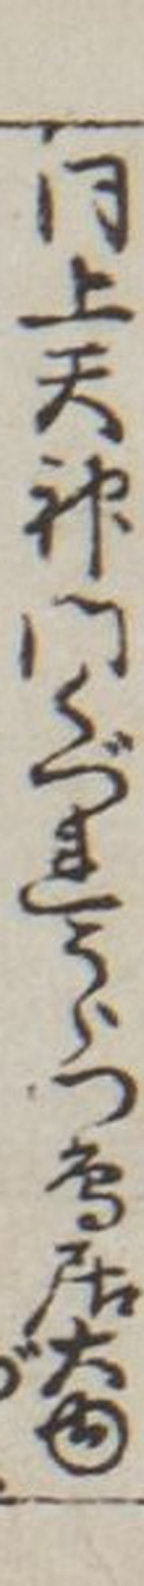同上天神門くづれうら門鳥居大ゆがみ
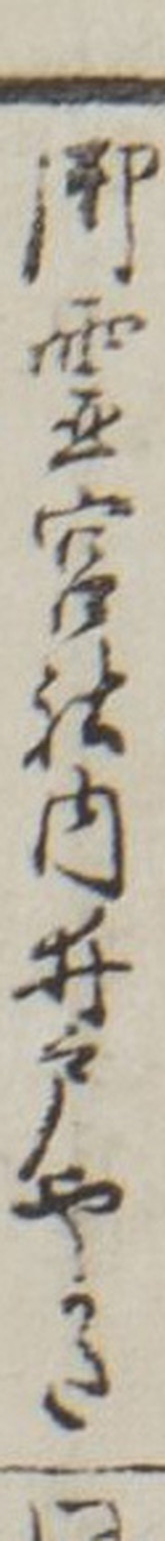御霊宮社内井戸やかた
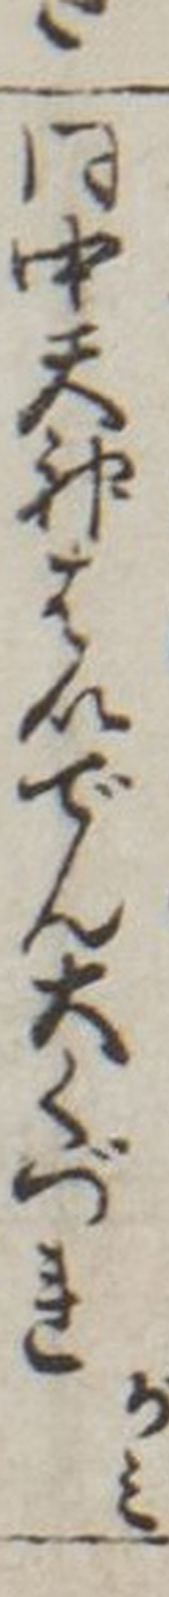同中天神はいでん大くづれ
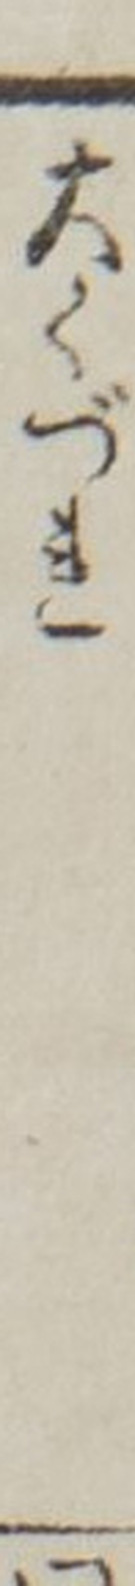大くづれ
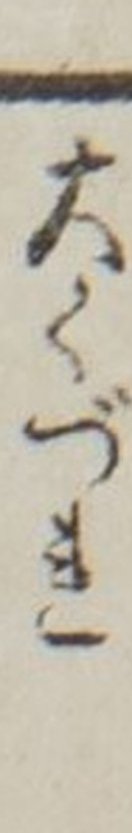大くづれ
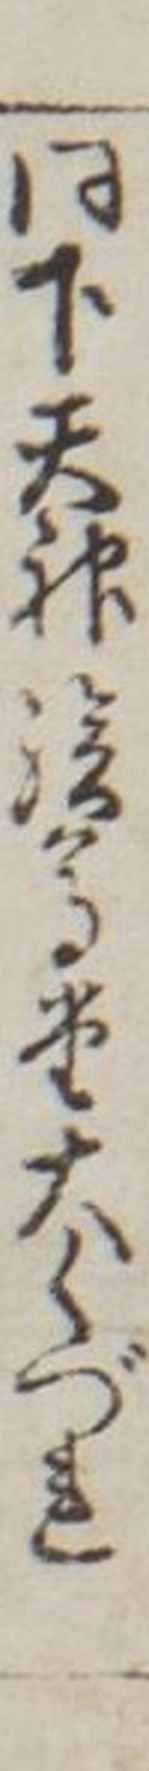同下天神絵馬堂大くづれ
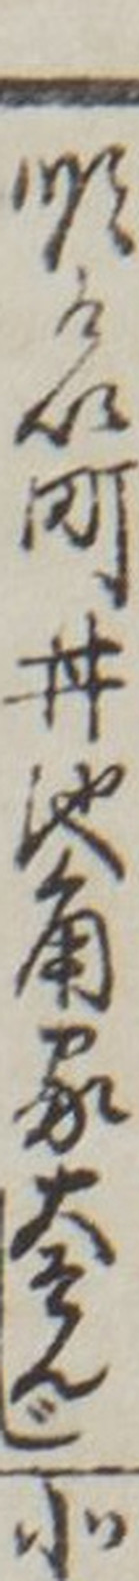順けい町丼池角家大そんじ
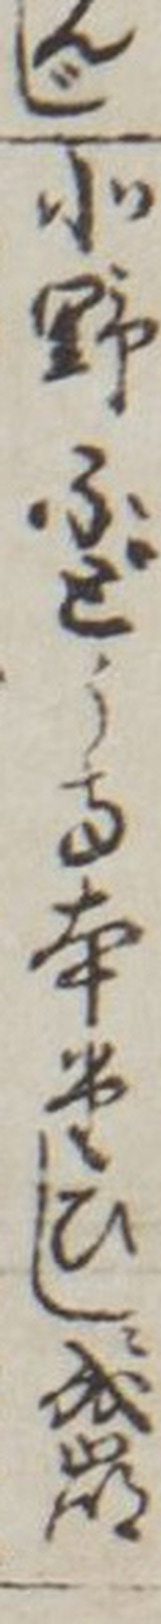北野ふどう寺本堂ひしに成崩
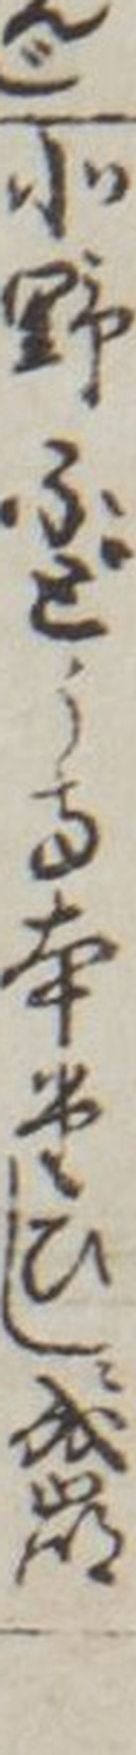北野ふどう寺本堂ひしに成崩
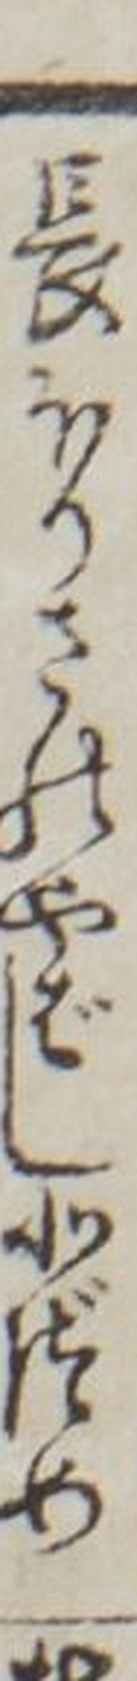長ほりさのやばし北ずめ
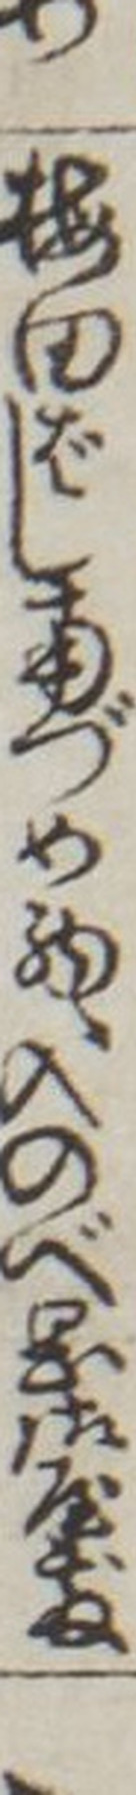梅田ばし南づめ西へ入のべ岡御屋敷
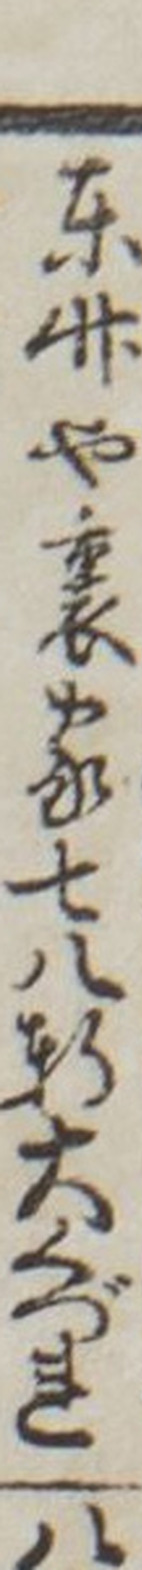東竹や裏家七八軒大くづれ
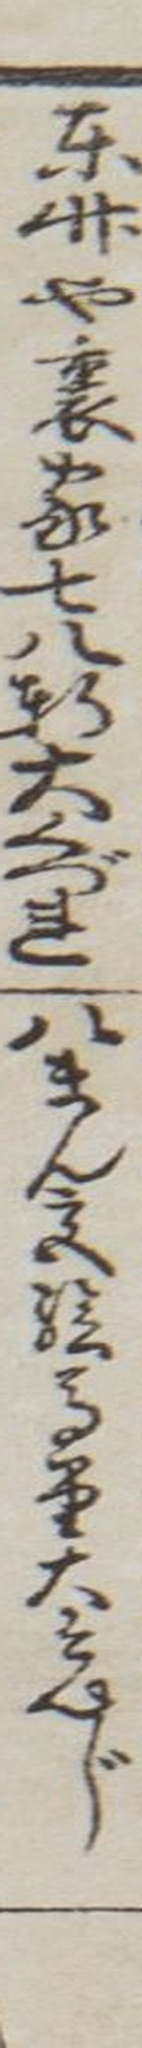東竹や裏家七八軒大くづれ
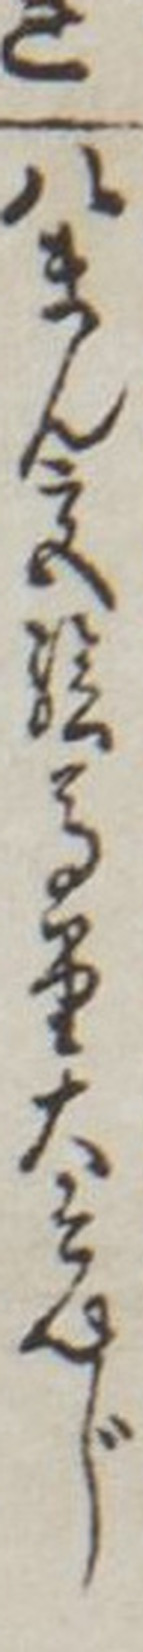八まん宮絵馬堂大そんじ
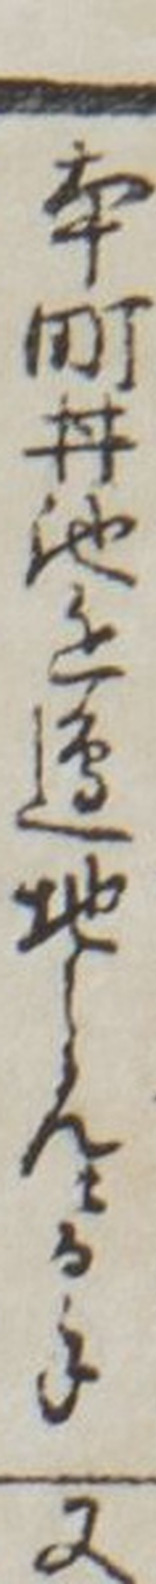本町丼池近辺地しんにて手
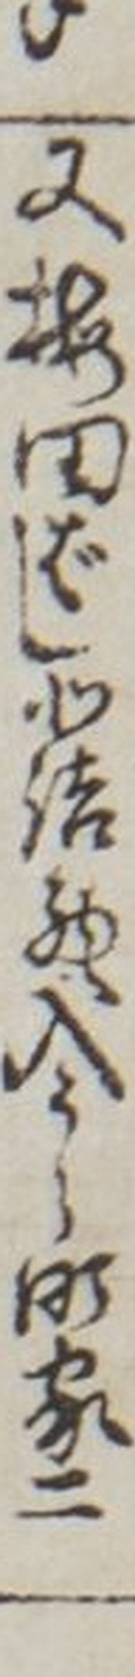又梅田ばし北詰西へ入うら町家二
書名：本しらべ大阪大地震の次第初編
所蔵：あいおいニッセイ同和損保株式会社
